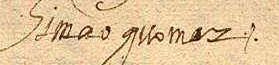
Simaõ guomez ./.
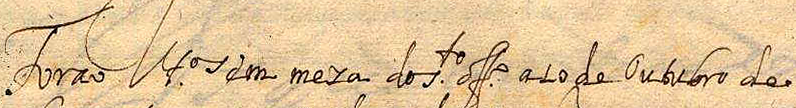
Forão Vt.os em meza do s.to off.o a 10 de Outubro de
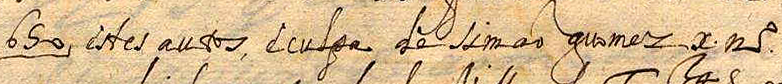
650, estes autos, e culpa de simaõ guomez x. no.
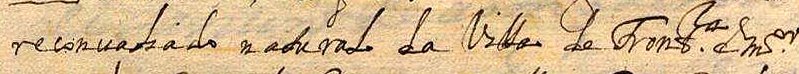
reconcialiado natural da Villa de Front.ra e m.or
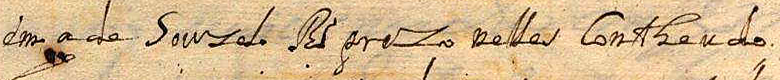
em a de Souzel R prezo nelles Contheudo
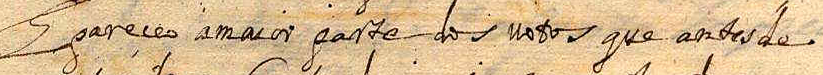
E pareçeo a maior parte dos uotos que antes de
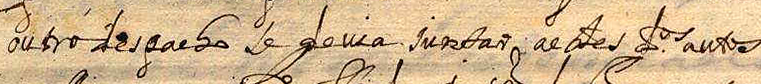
outro despacho se deuia iuntar a estes d̄.tos autos
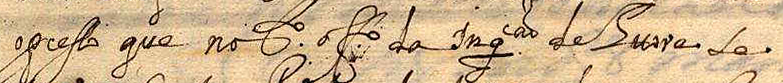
o ꝓcesso que no s.to. off.o da Inq.cão de Euora se
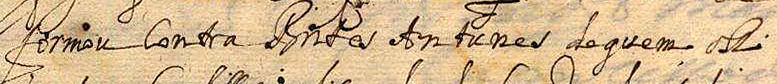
formou Contra Brites Antunes de quem o R.
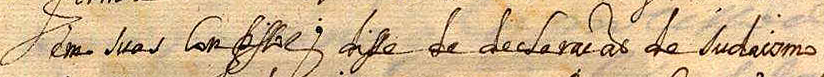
em suas confissoes disse de declaracão de Iudaismo
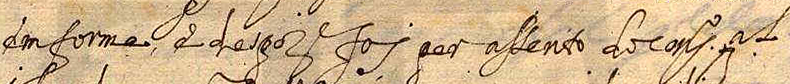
em forma e despois foj per assento do cons.o g.al
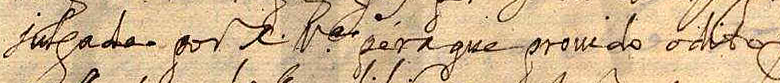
Iulgada por X. V.a pera que prouido o dito
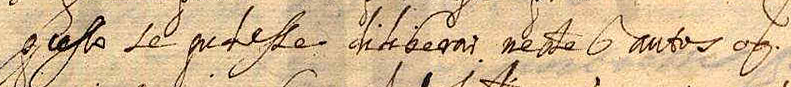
ꝓcesso se pudesse diliberar nestes autos o q̄
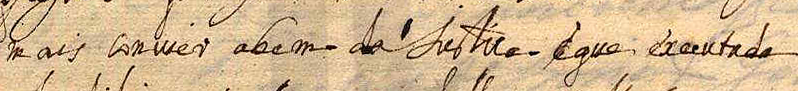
mais conuier a bem da Iustica. e que executada
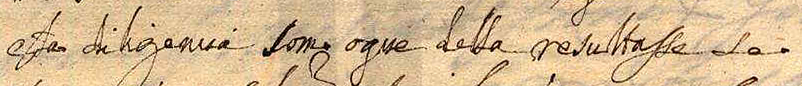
esta diligencia Com o que della resultasse se
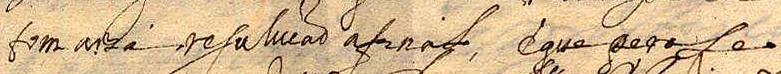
tomaria resulucãoaõ a final, e que pera se
